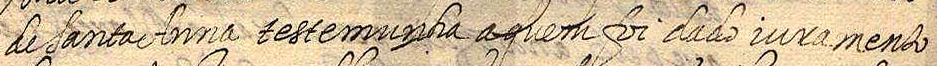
de Santa Anna testemunha a quem foi dado iuramento
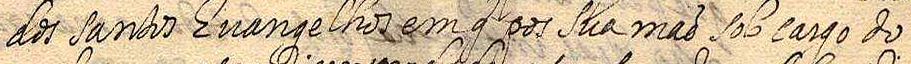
dos santos Euangelhos em q̄ pos sua maõ sob cargo do
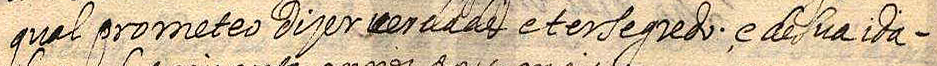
qual prometeo dizer uerdade e ter segredo; e de sua ida
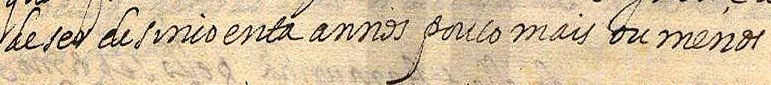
de ser de sincoenta annos pouco mais ou menos
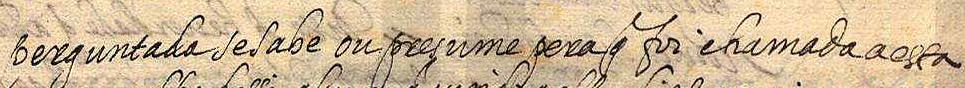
perguntada se sabe ou presume pera q̄ foi chamada a esta
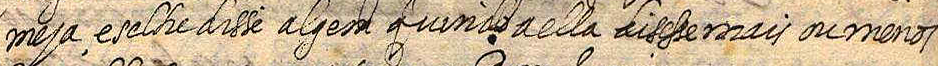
meza e se lhe disse algem q̄ uindo a ella disesse mais ou menos
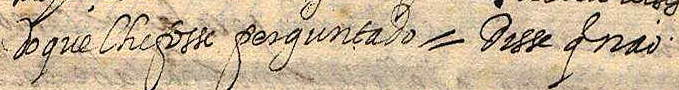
do que lhe fosse perguntado = Disse q̄ nao
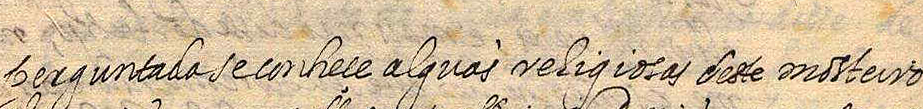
perguntada se conhece alguas religiosas deste mosteiro
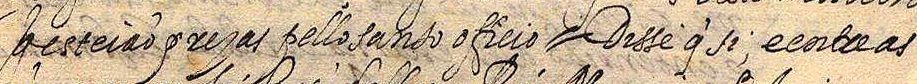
q̄ esteiaõ prezas pello santo officio = Disse q̄ si; e entre as
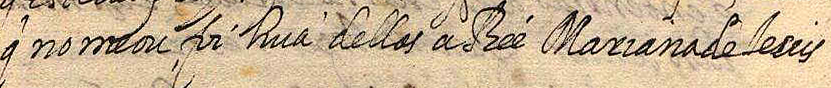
q̄ nomeou, foi hua dellas a Reé Mariana de Iesus
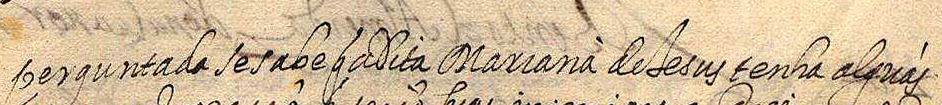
perguntada se sabe q̄ a dita Mariana de Iesus tenha alguās
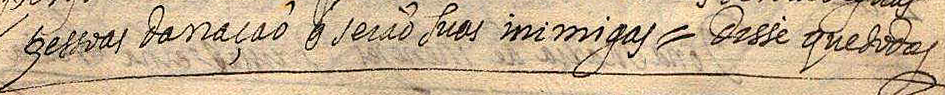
pessoas da naçaõ q̄ seiaõ suas inimigas = Disse que todas
